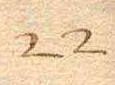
22
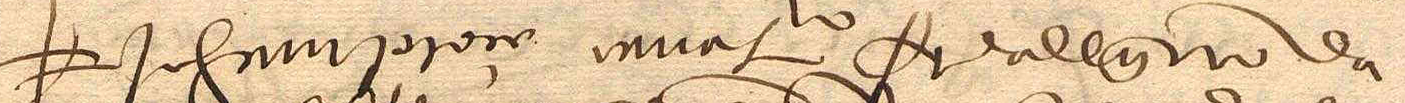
item Joham proçe cauaLro fydallguo da
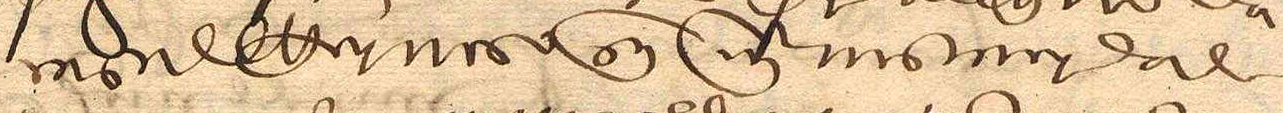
casa del Rey noso s̄r mor nesta cydade
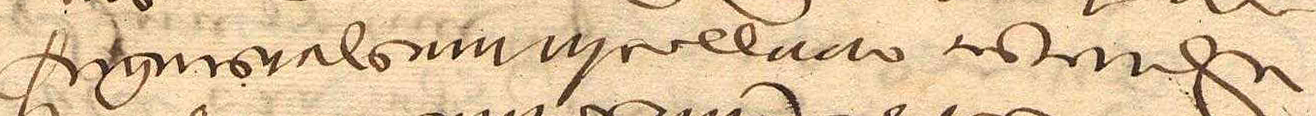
freguesya de sam njcollaao testemha
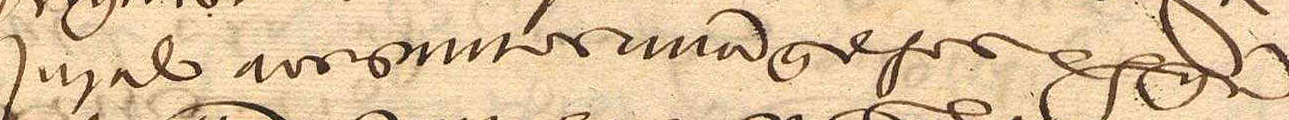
Jurado aos santos auāgelhos e ꝑgū
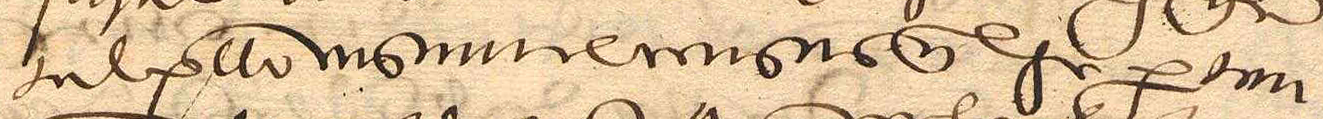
tado p̄llo custume e cousas q̄ lhe ꝑten
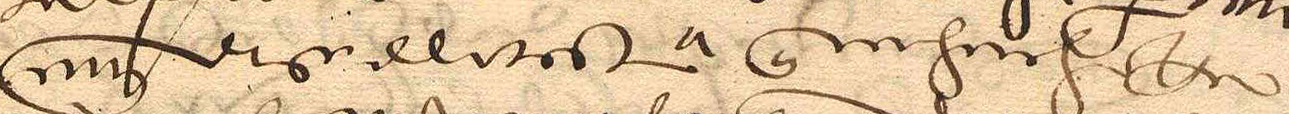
cem dise elle testa q̄ conhece ho Reo
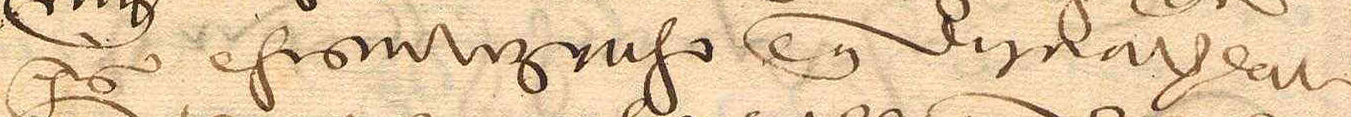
p̄so e he seu vezynho e q̄ dira a ꝟdade
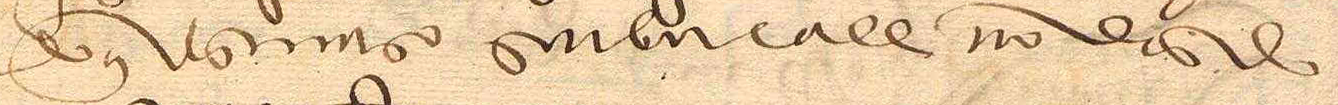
do q̄ deste caso souber e all n̄o dise do
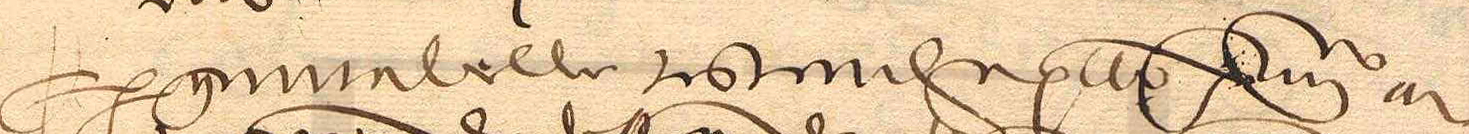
item ꝑguntado elle testemunha p̄llo p̄mro ar
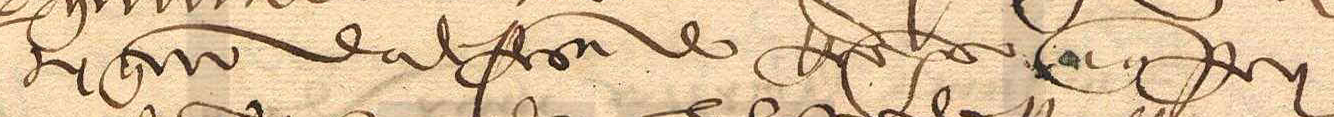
tyguo da defesa do Reo p̄so a q̄ foy
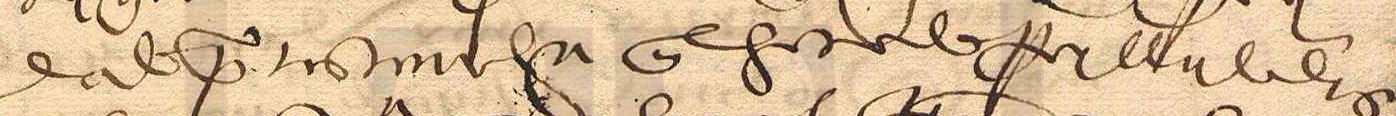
dado p̄o testemunha q̄ lhe todo foy llydo dise
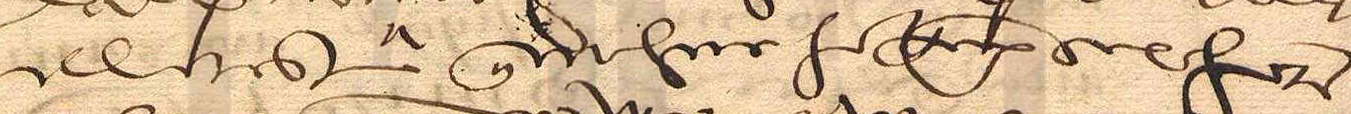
elle testa q̄ conhece ho Reo p̄so e ho tē
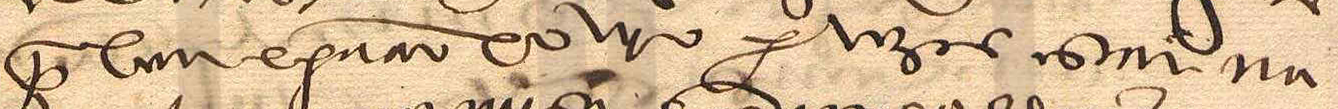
p̄o bom xpaão e o vyo ꝑ vezes estar na
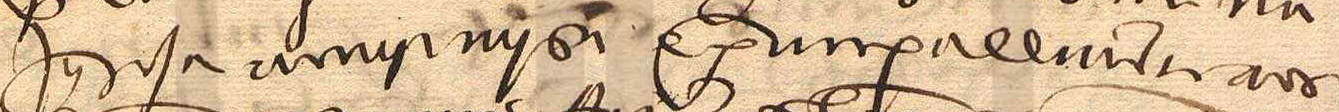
JgreJa a ouujr mjsa e p̄ncipallmēte aos
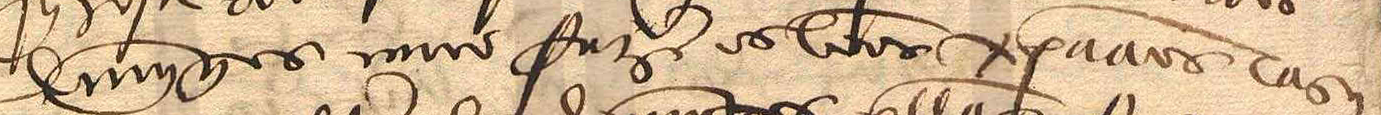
dom̄ygos como fazē os bōos xpaãos e asy
